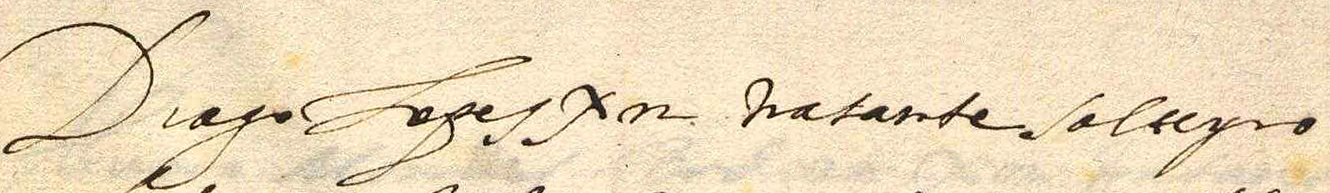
Diogo Lopes x n tratante solteyro
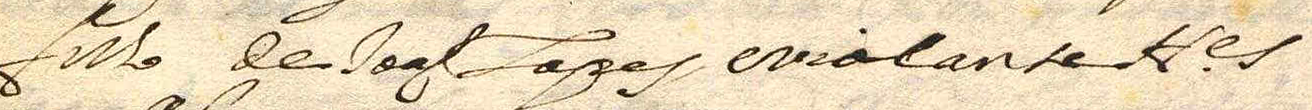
filho de Ioaõ Lopes, e violante H.es
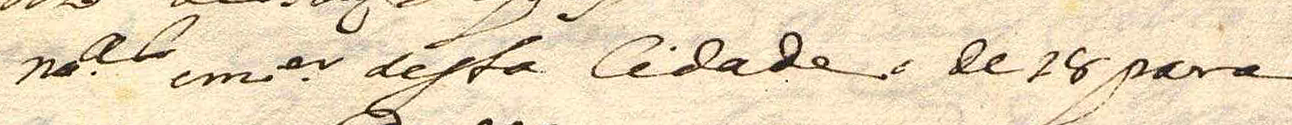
na.al e m.or desta Cidade e de 28 para
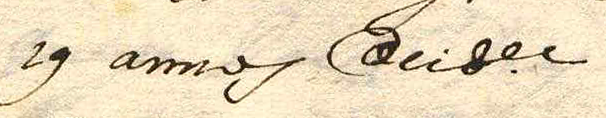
29 annos de id.de
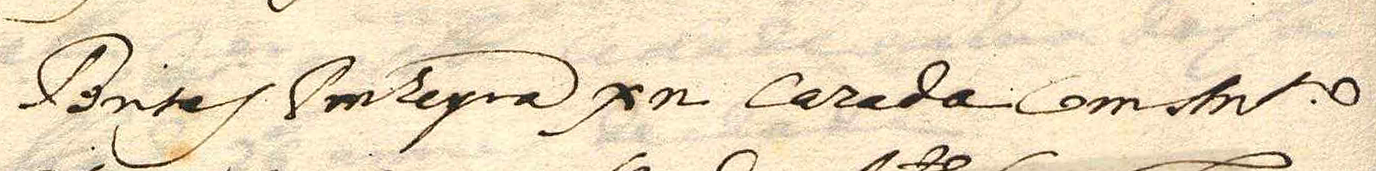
Brites Pinheyra x n cazada com Ant.o
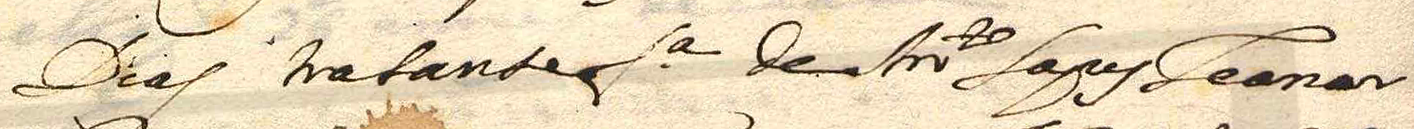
Dias tratante f.a de Anto Lopes Leonor
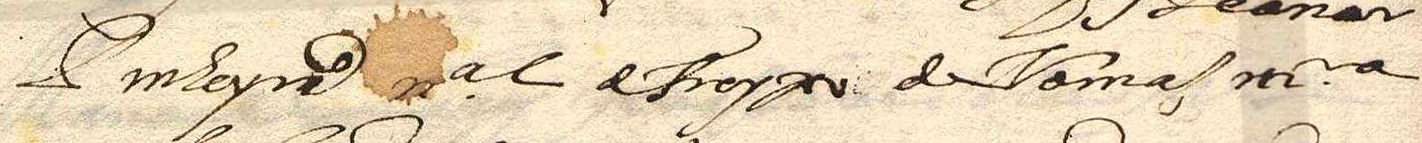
Pinheyra n.al d freyxo de Nomā m.ra
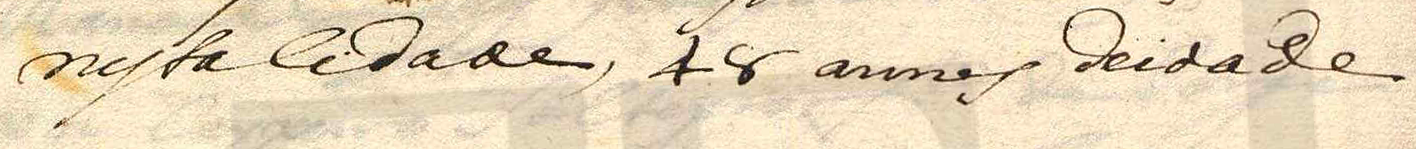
nesta cidade, 48 annos de idade
